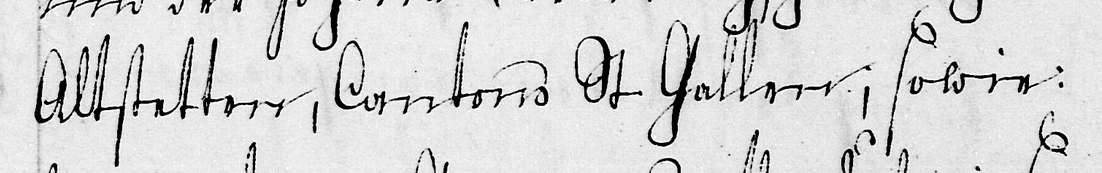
Altstetten, Cantons St. Gallen, sowie:
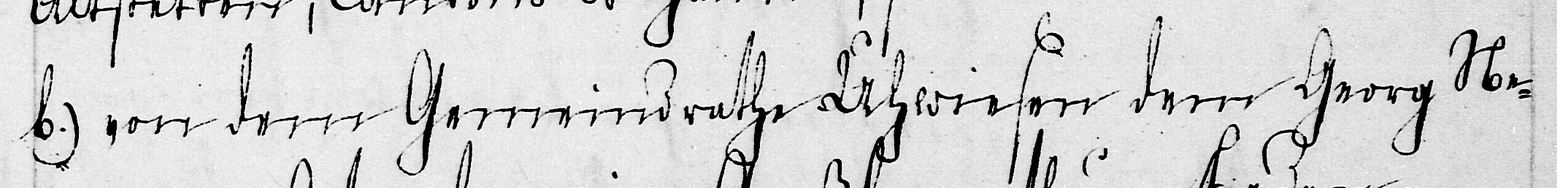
b.) von dem Gemeindrathe Uhwiesen dem Georg Ne¬
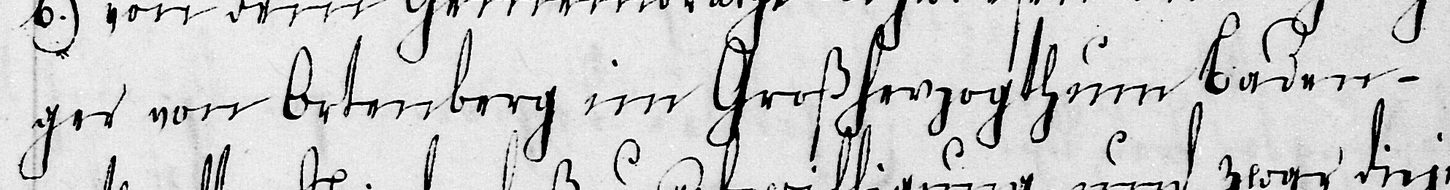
ger von Ortenberg im Großherzogthum Baden –
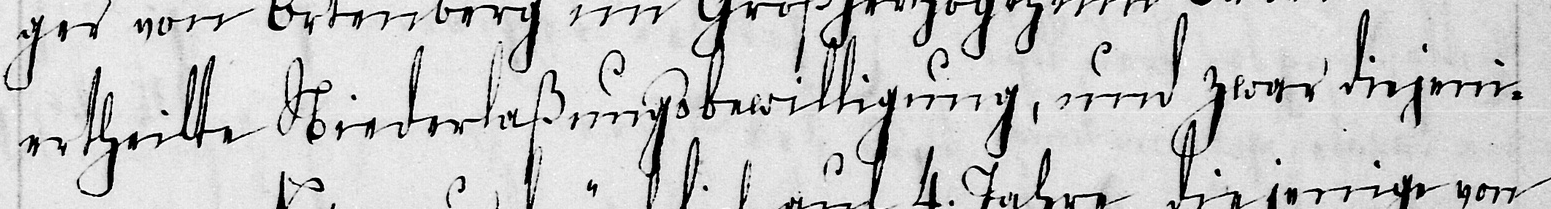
ertheilte Niederlaßungsbewilligung, und zwar diejeni¬
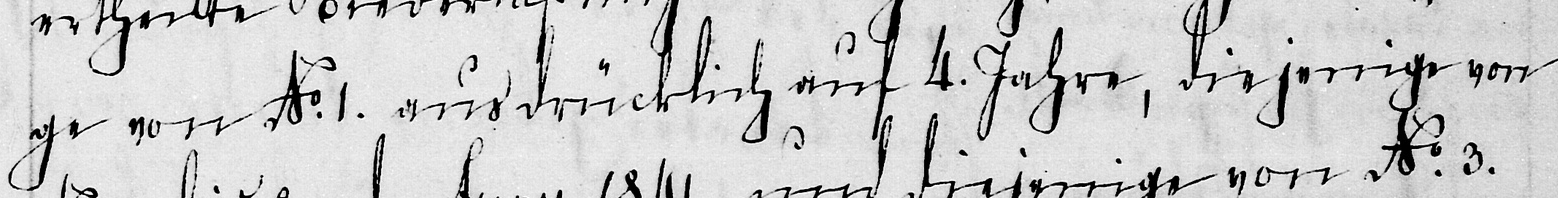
ge von No. 1. ausdrücklich auf 4. Jahre, diejenige von
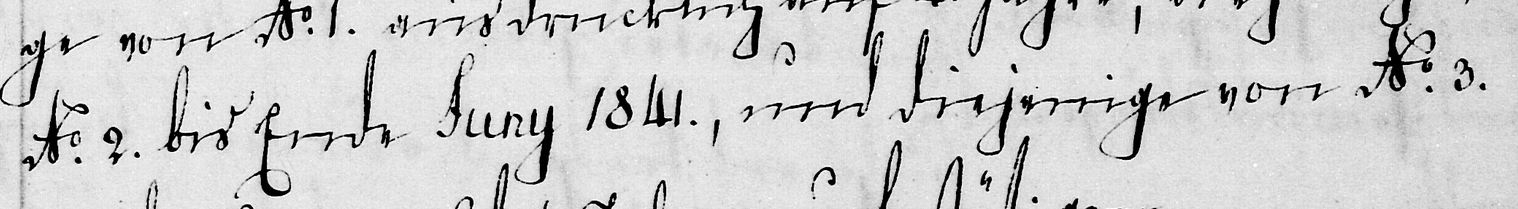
No. 2. bis Ende Juny 1841., und diejenige von No. 3.
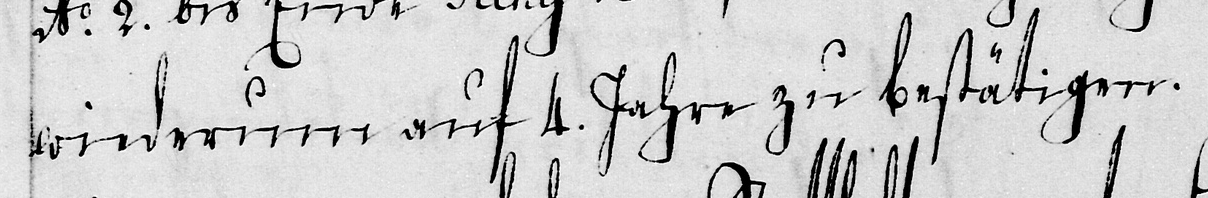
wiederum auf 4. Jahre zu bestätigen.
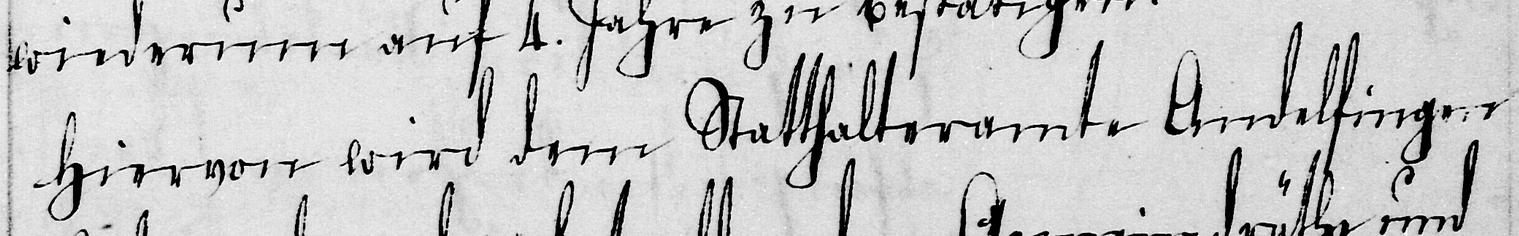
Hiervon wird dem Statthalteramte Andelfingen
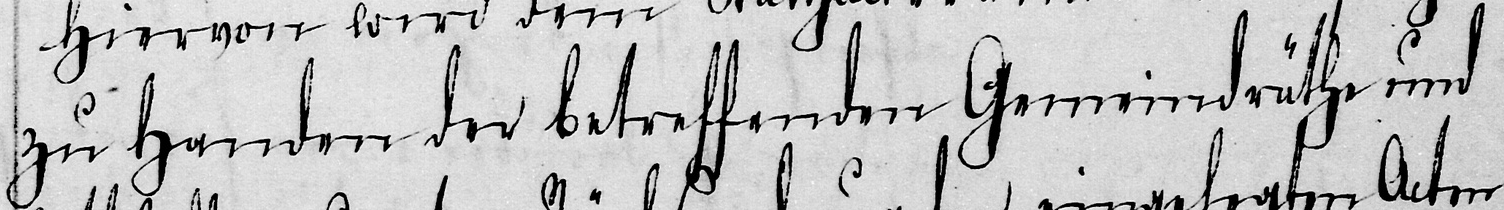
zu Handen der betreffenden Gemeindräthe und
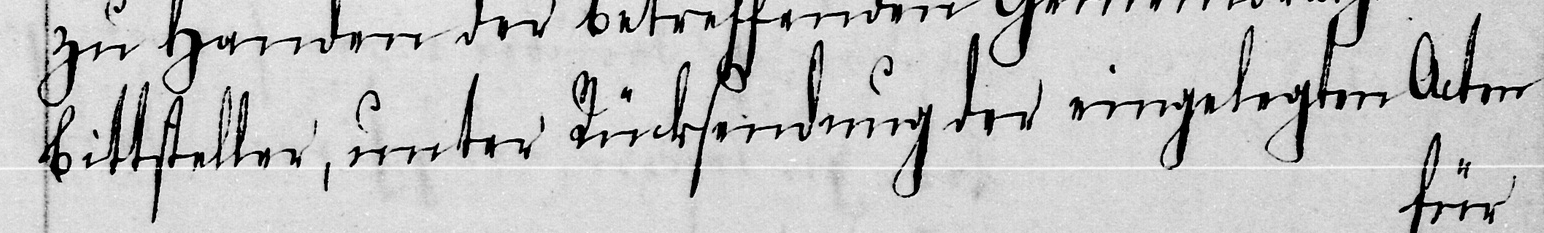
Bittsteller, unter Rücksendung der eingelegten Acten
